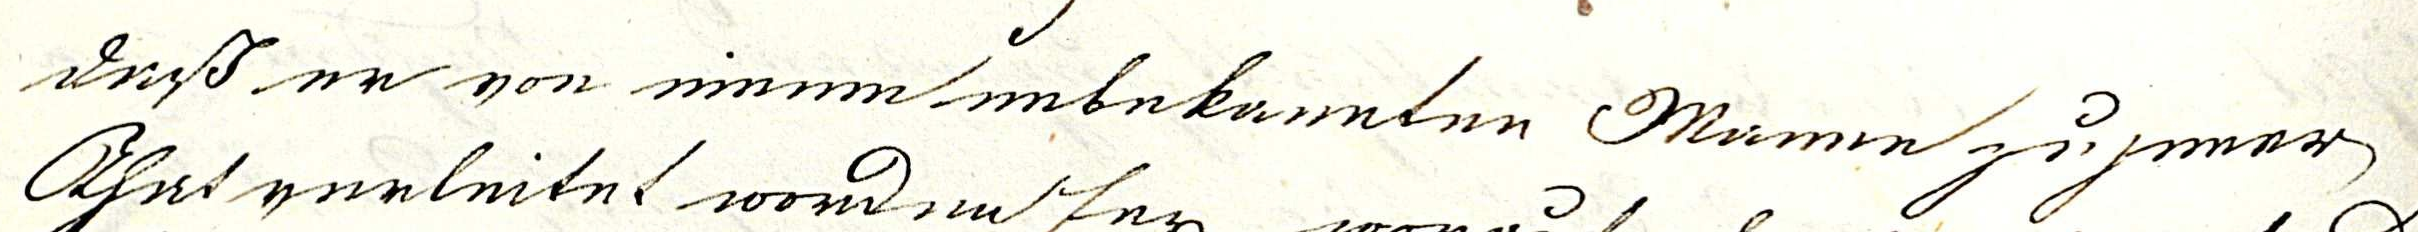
daß er von einem unbekannten Manne zu jener
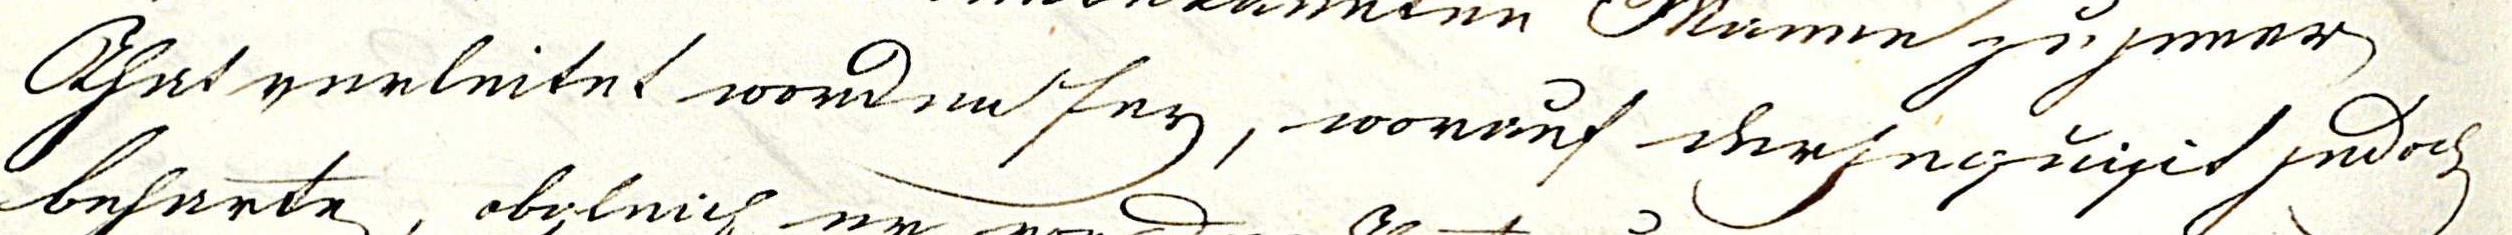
That verleitet worden sey, worauf der Inquisit jedoch
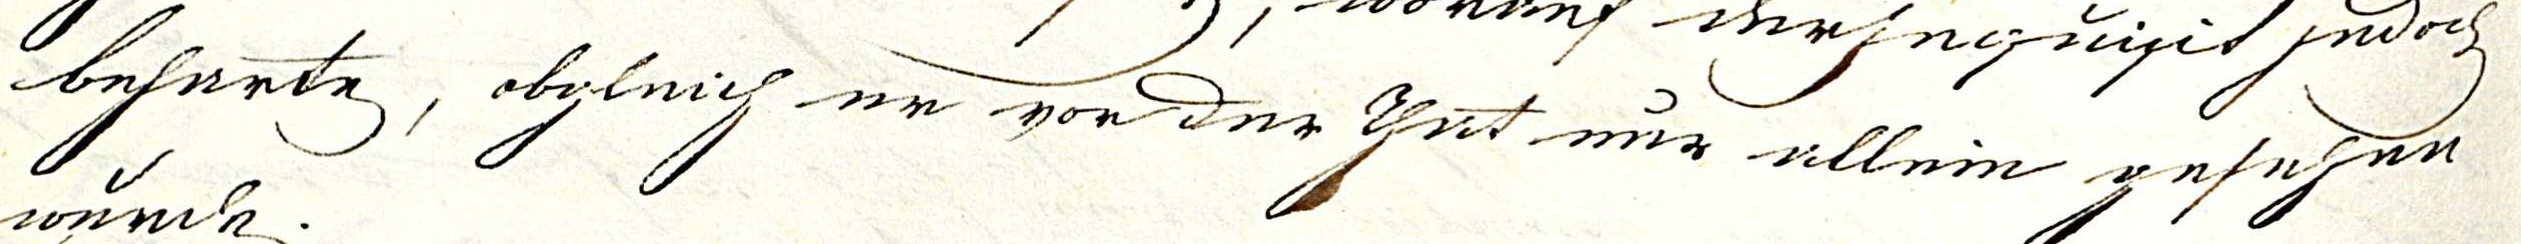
beharrte, obgleich er vor der That nur allein gesehen
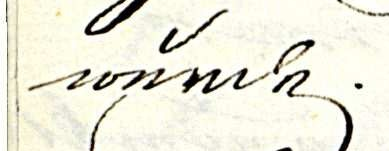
wurde.
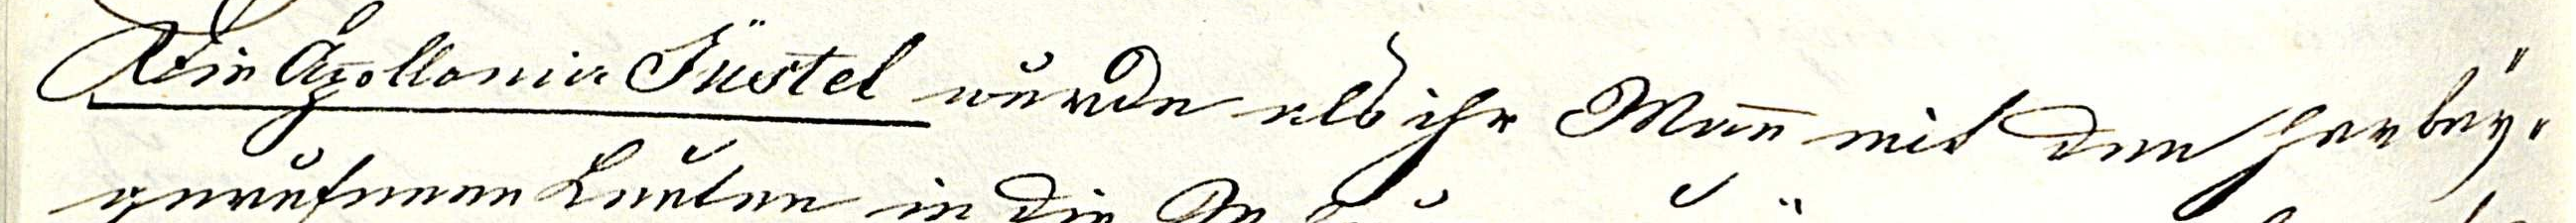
Die Apollonia Jüstel wurde als ihr Mann mit dem herbey¬
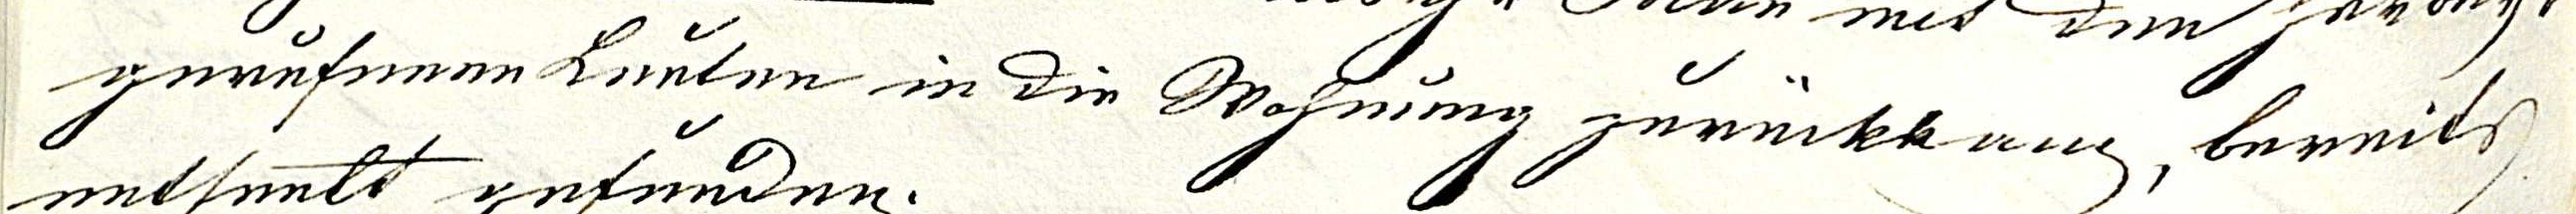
gerufenen Leuten in die Wohnung zurückkam, bereits
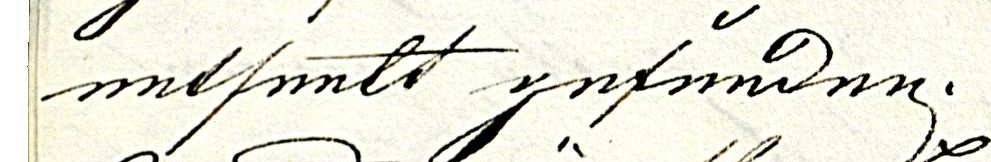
entseelt gefunden.
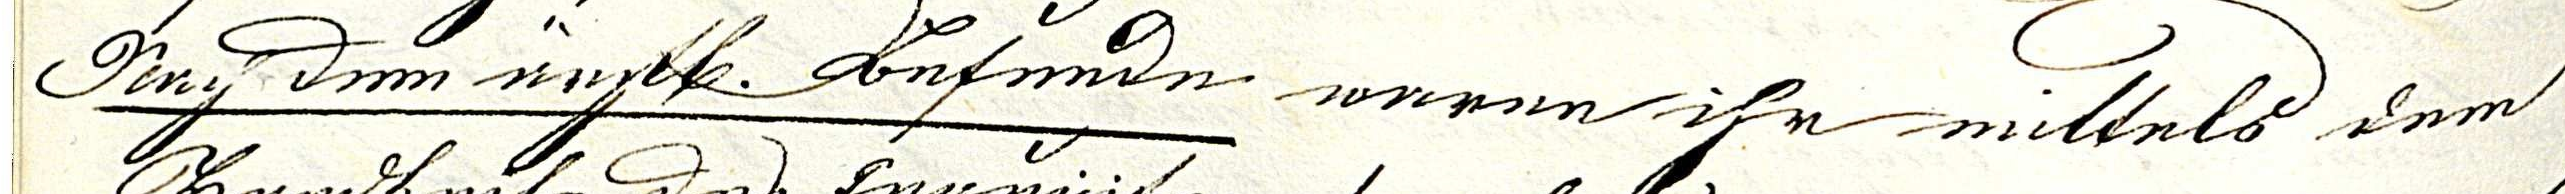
Nachdem ärztl. Befunde waren ihr mittels dem
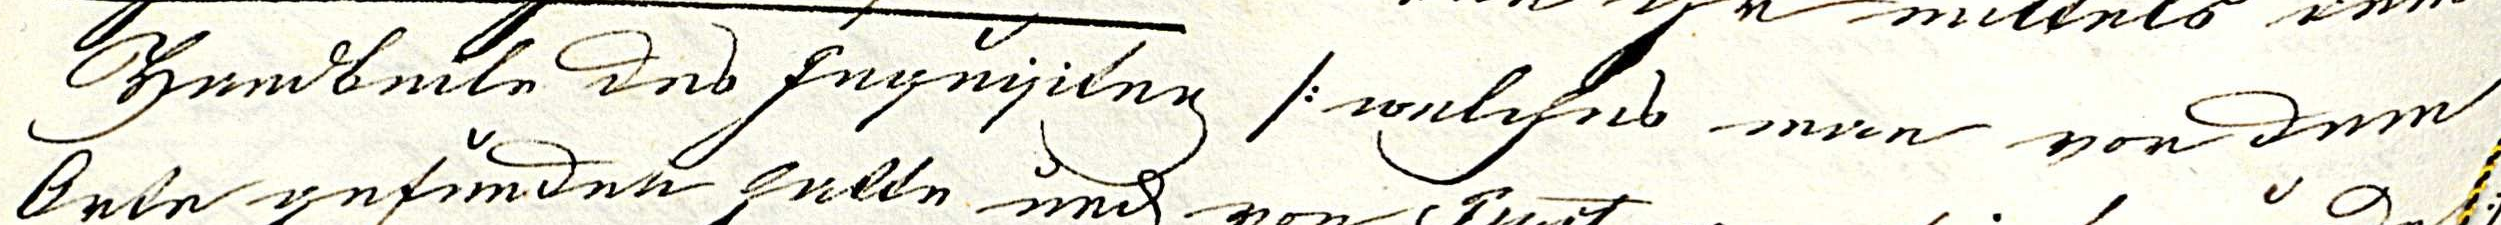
Handbeile des Inquisiten (welches man von dem
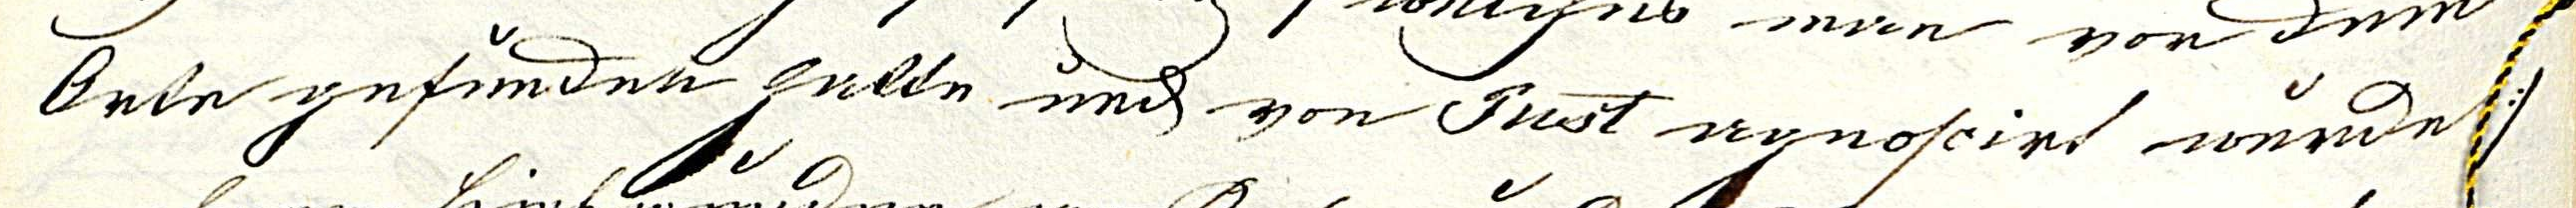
Orte gefunden hatte und von Just agnoscirt wurde)
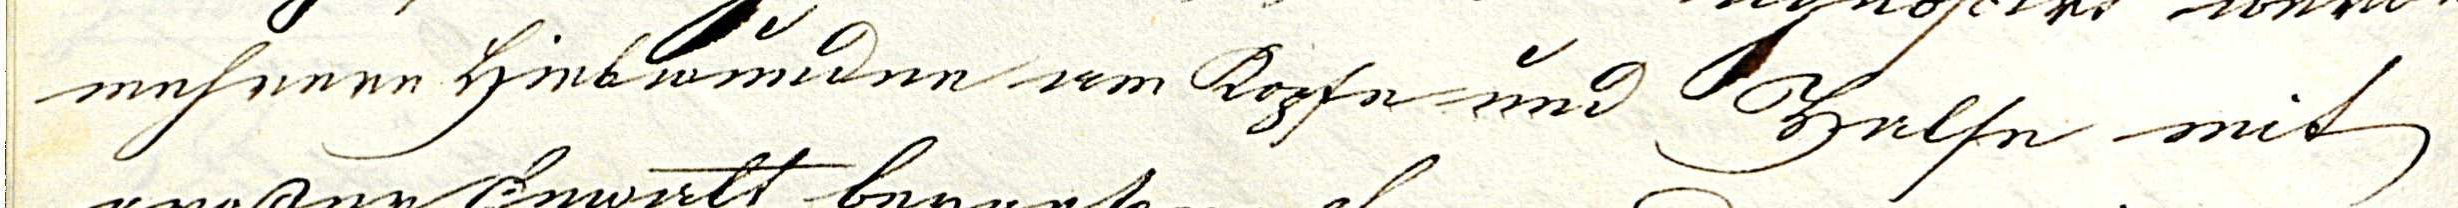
mehrere Hiebwunden am Kopfe und Halse mit
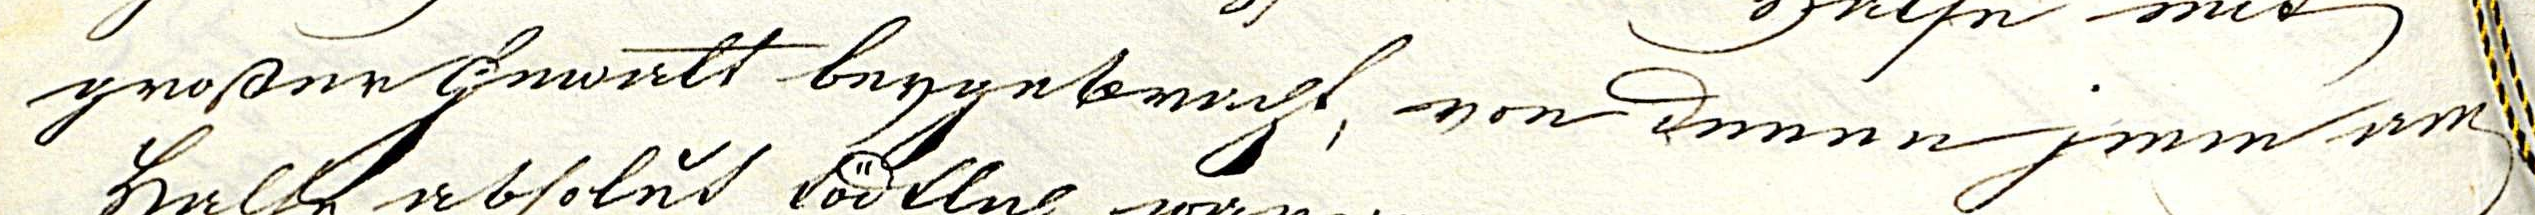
großer Gewalt beygebracht, von denen jene am
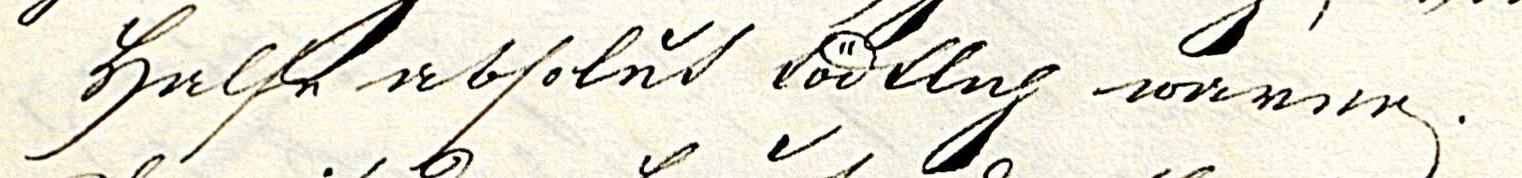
Halse absolut tödtlich waren
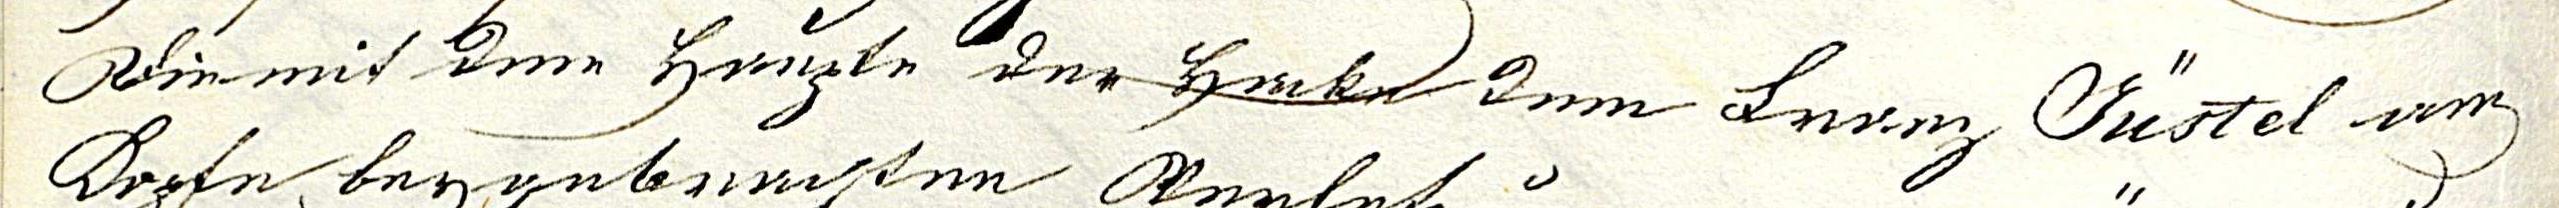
Die mit dem Haupte der Hacke dem Franz Jüstel am
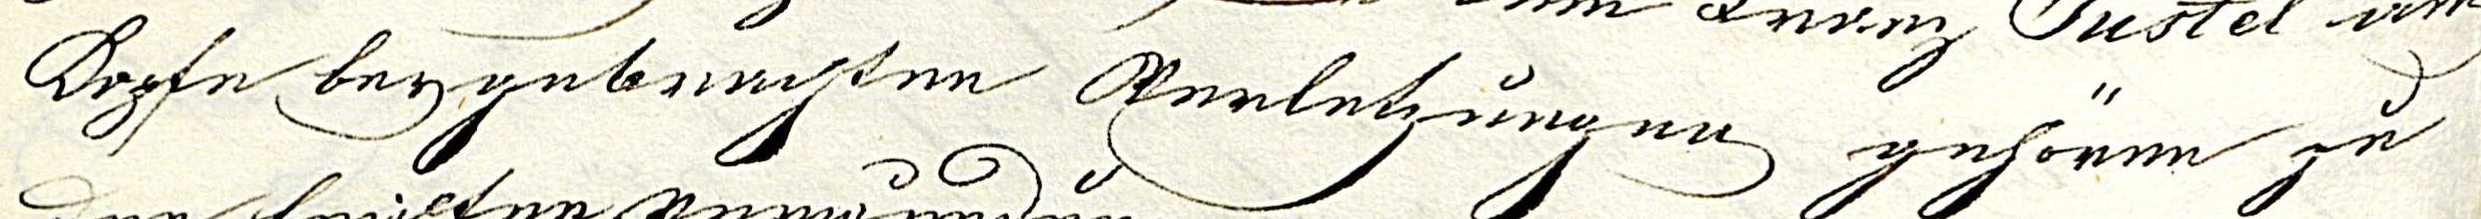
Kopfe beygebrachte Verletzungen gehören zu
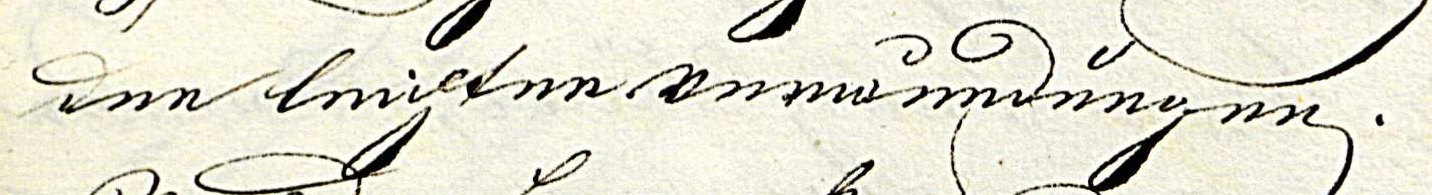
den leichten verwundungen.
